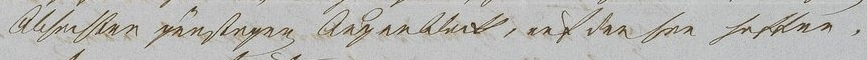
Absichten günstigen Augenblick, auf den sie hoffen,
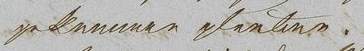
gekommen glauben.
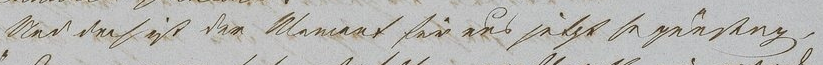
Und doch ist der Moment für uns jetzt so günstig,
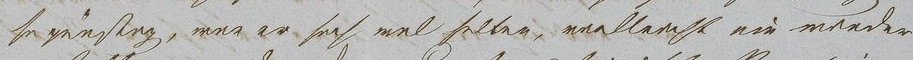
so günstig, wie er sich wol selten, vielleicht nie wieder
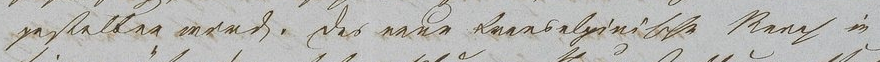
gestalten wird. Das neue transalpinische Reich in
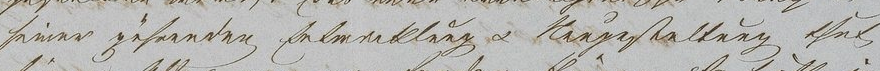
seiner gährenden Entwicklung & Neugestaltung thut
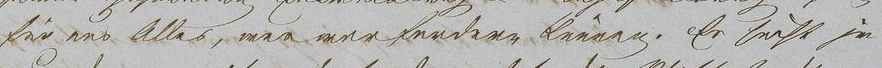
für uns Alles, was wir fordern können. Es sucht ja
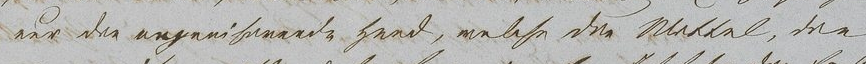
nur die organisirende Hand, welche die Mittel, die
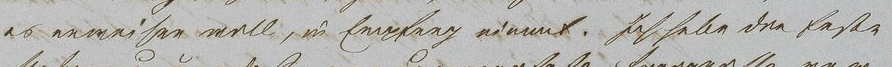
es anweisen will, in Empfang nimmt. Ich habe die feste
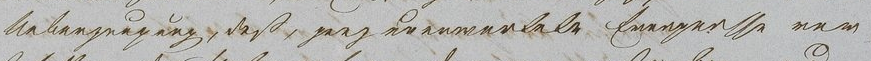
Ueberzeugung, daß ganz unerwartete Ereignisse vor-
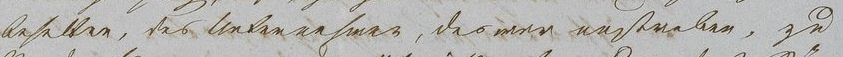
behalten, das Unternehmen, das wir anstreben, zu
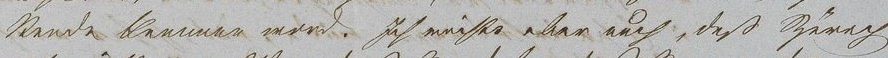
Stande kommen wird. Ich möchte aber auch, daß Zürich,
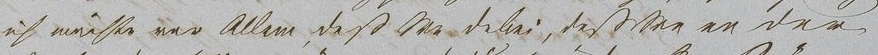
ich möchte vor Allem, daß Sie dabei, daß Sie an der
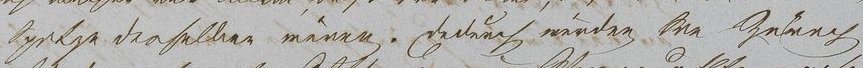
Spitze desselben wären. Dadurch würden Sie Zürich
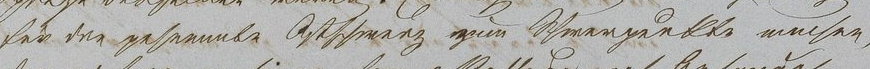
für die gesammte Ostschweiz zum Schwerpunkte machen,
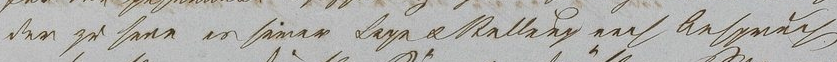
der zu sein es seiner Lage & Stellung nach Anspruch
